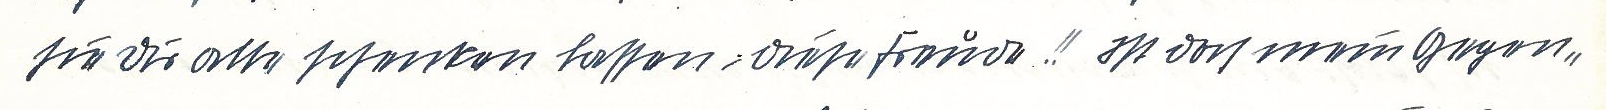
sie Dir alle schenken lassen, diese Freude!! Ist doch mein Gegen¬
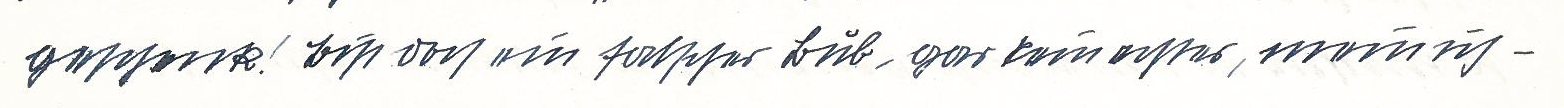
geschenk! Bist doch ein falscher Bub, gar kein echter, mein ich –
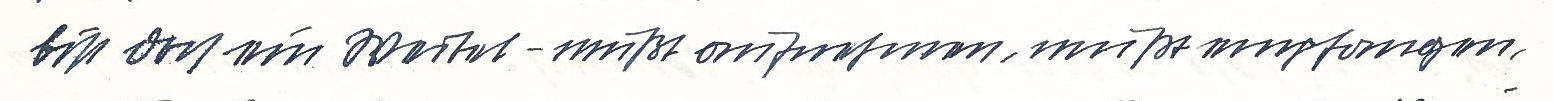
bist doch ein Weibel – mußt aufnehmen, mußt empfangen,
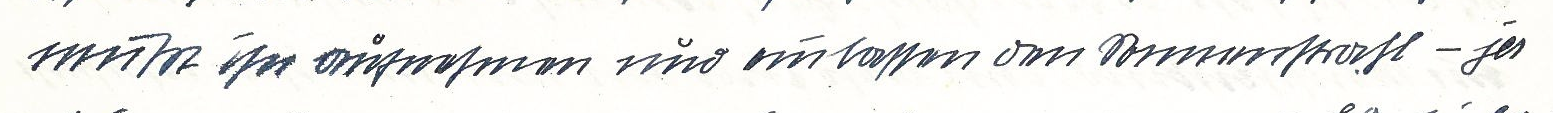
mußt ihn aufnehmen und einlassen den Sonnenstrahl – ja
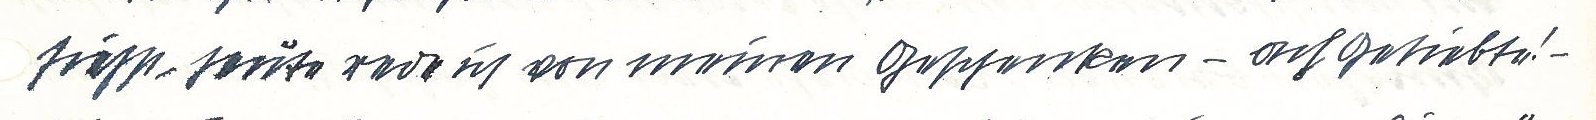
siehst, heute rede ich von meinen Geschenken – ach Geliebte! –
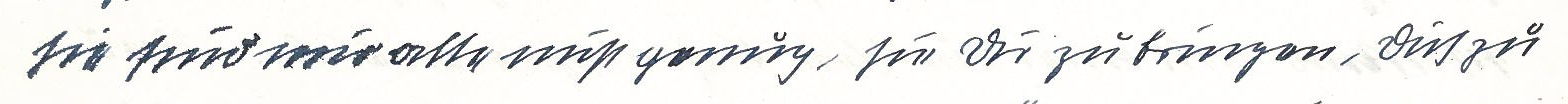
sie sind mir alle nicht genug, sie Dir zu bringen, Dich zu
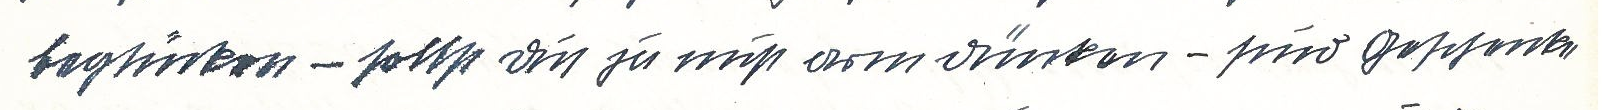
beglücken – sollst Dich ja nicht arm dünken – sind Geschenke
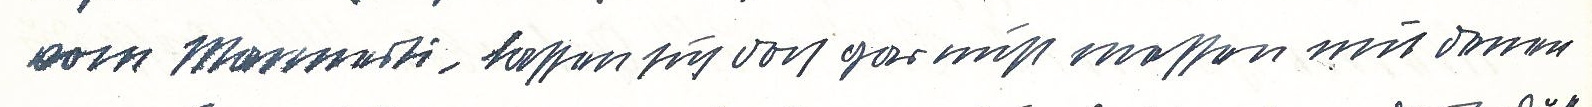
vom Mannerli, lassen sich doch gar nicht messen mit denen
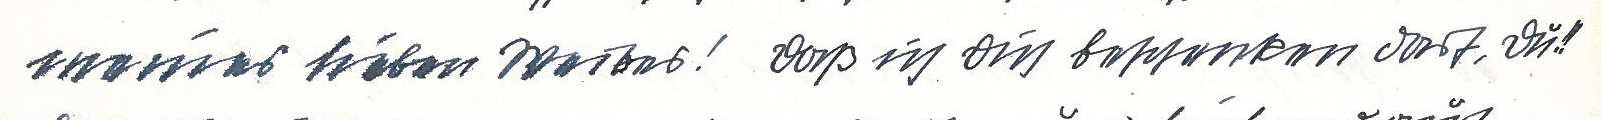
meines lieben Weibes! Daß ich Dich beschenken darf, Du!!
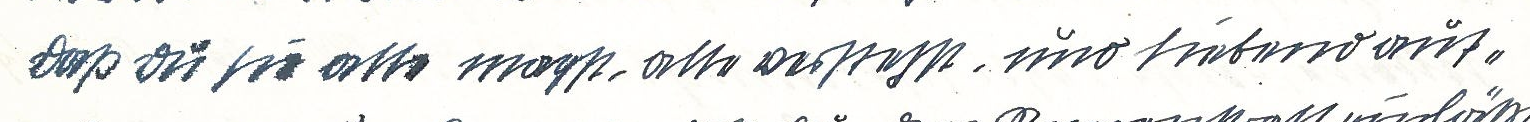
Daß Du sie alle magst, alle verstehst, und liebend auf¬
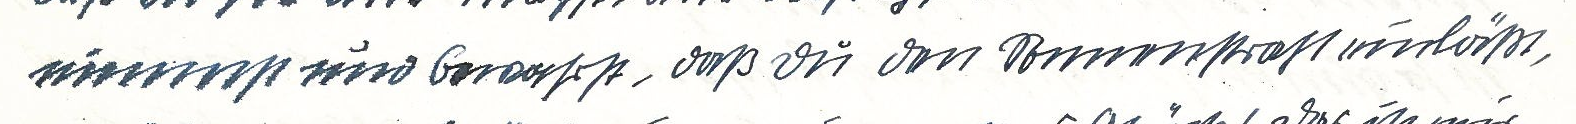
nimmst und bewahrst, daß Du den Sonnenstrahl einläßt,
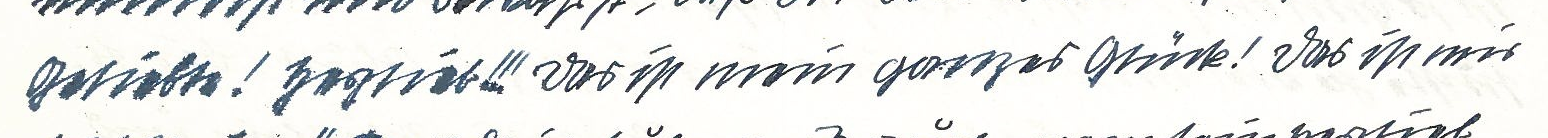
Geliebte! Herzlieb!!! Das ist mein ganzes Glück! Das ist mir
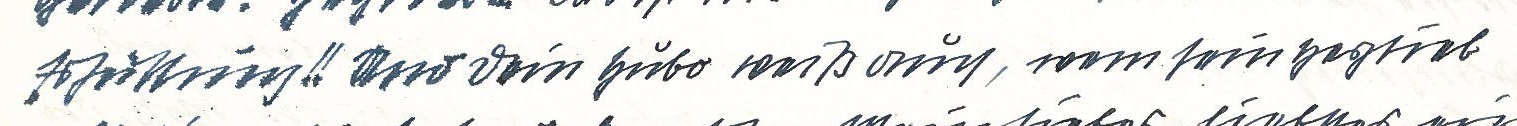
Erfüllung!! Und Dein Hubo weiß auch, wem sein Herzlieb
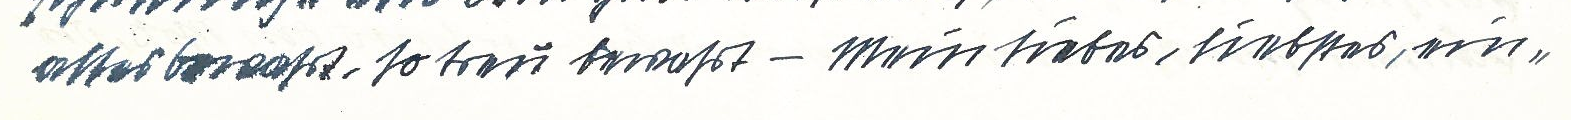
alles bewahrt, so treu bewahrt – Mein liebes, liebstes, ein¬
